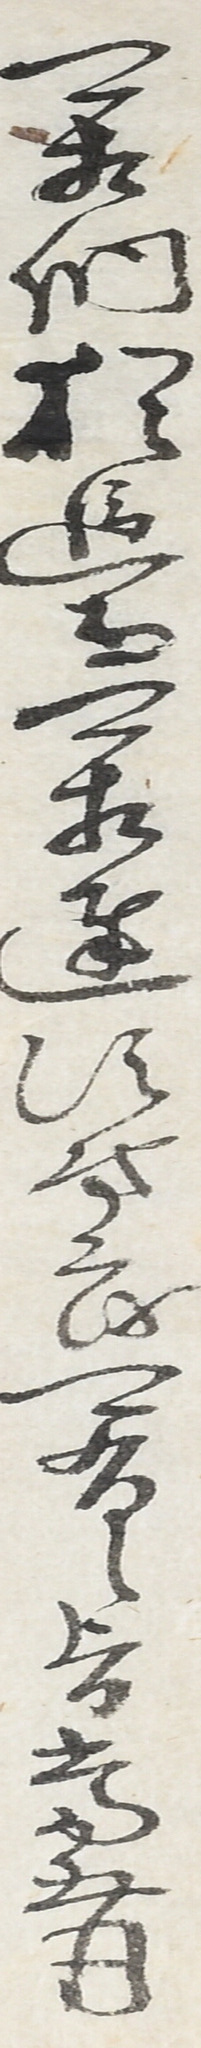可相納猶追て可相達次第も可有之旨当五月
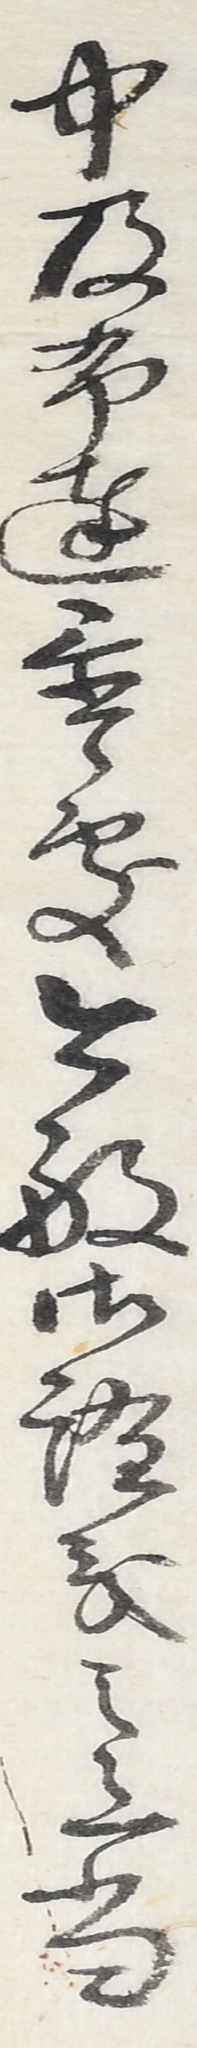中及布達置候処今般御詮義之上当

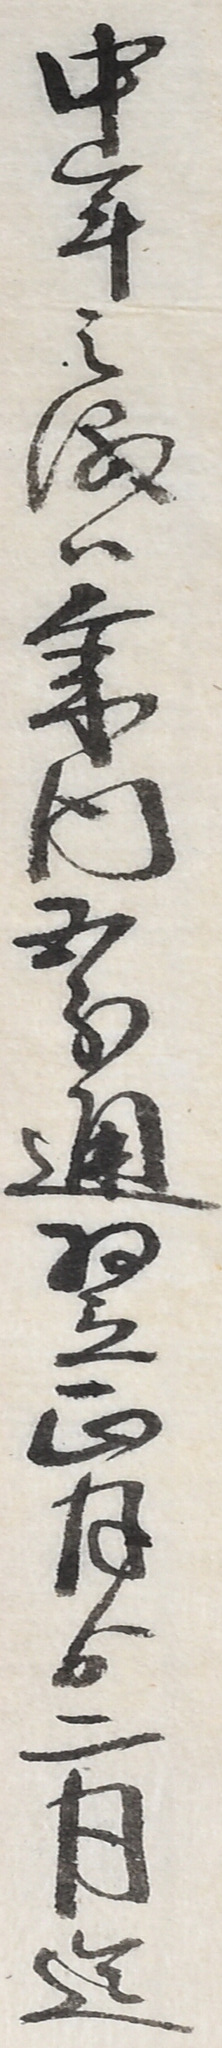申年之儀は年内五分通翌正月より二月迄
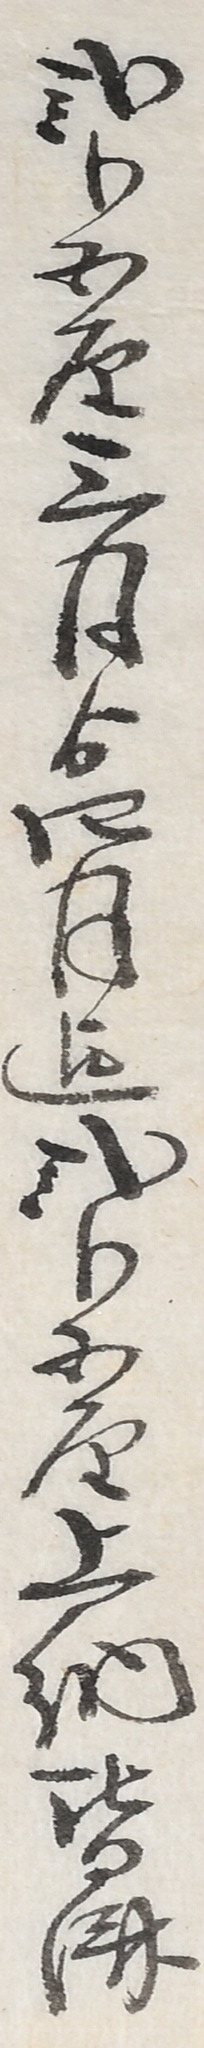弐分五厘三月より四月迄弐分五厘上納皆済
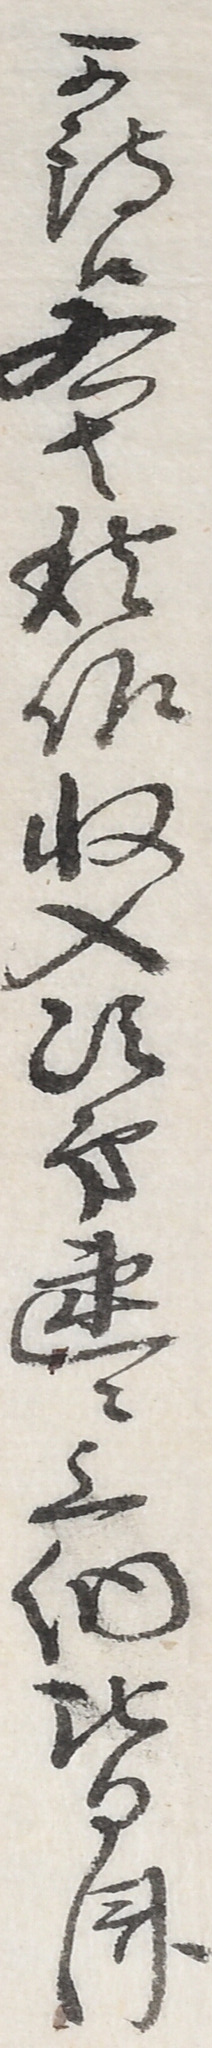可致候右は秋作収入次第速に上納皆済
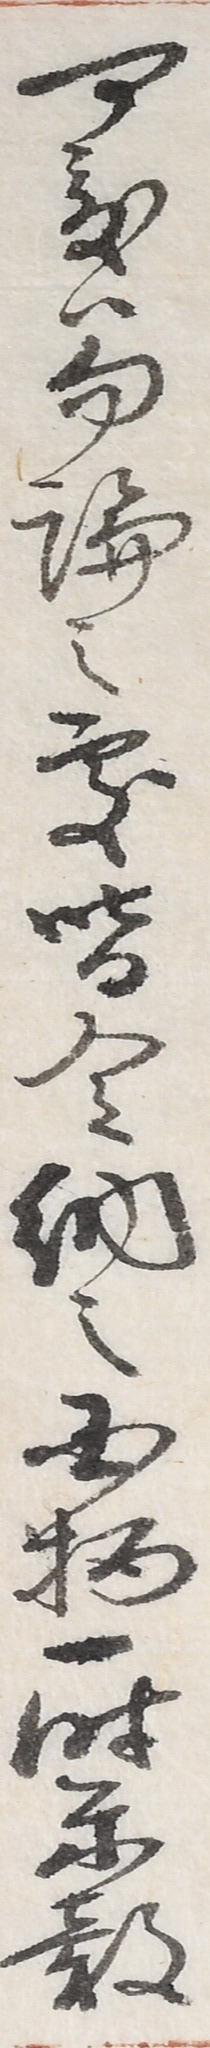可致は勿論之処皆全納之国柄一時米穀
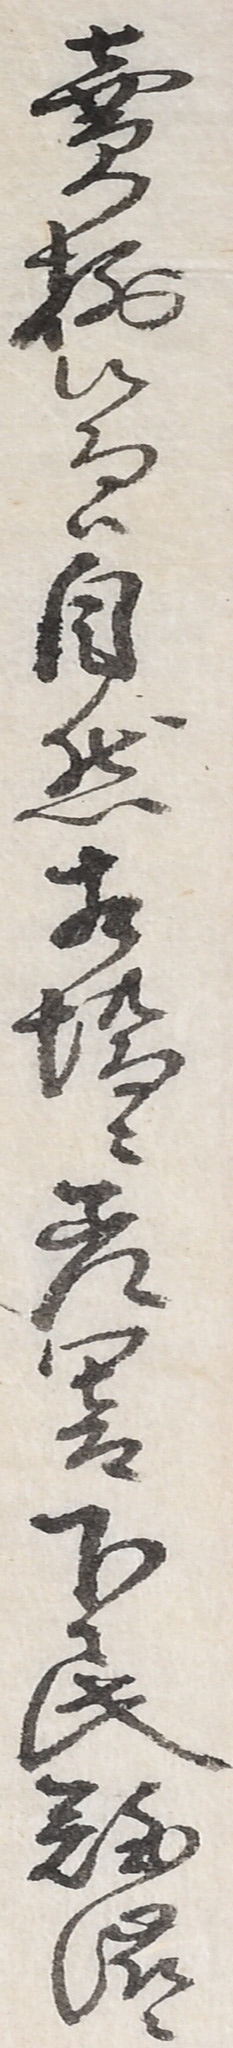売捌候ては自然相場に差響下民難渋に
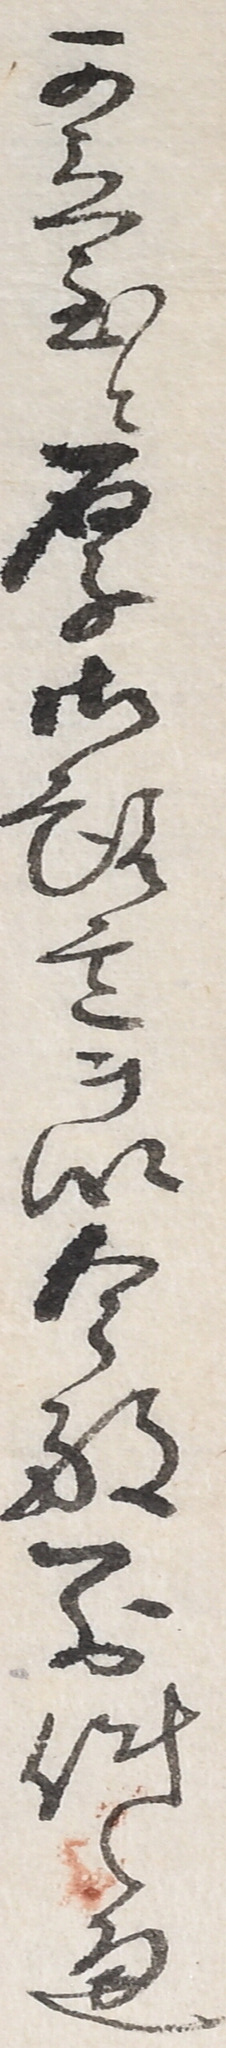可立至と厚御趣意を以今般別件之通
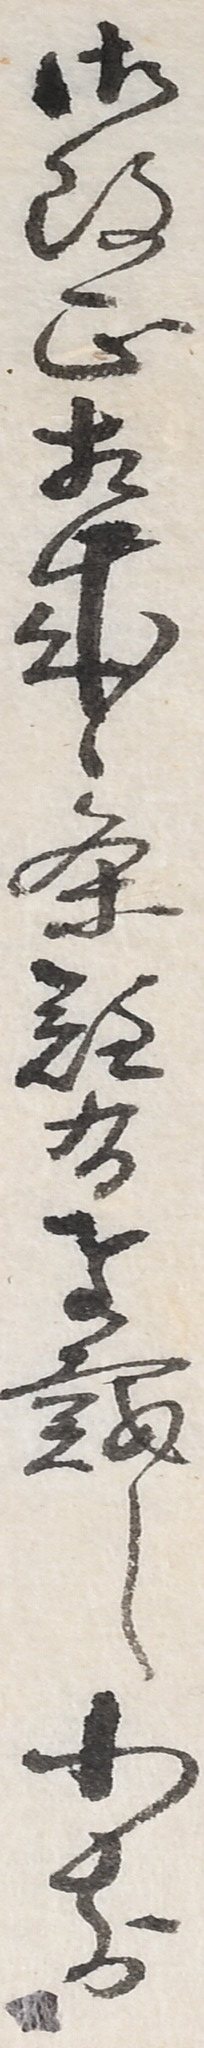御改正相成候条難有奉戴し小前
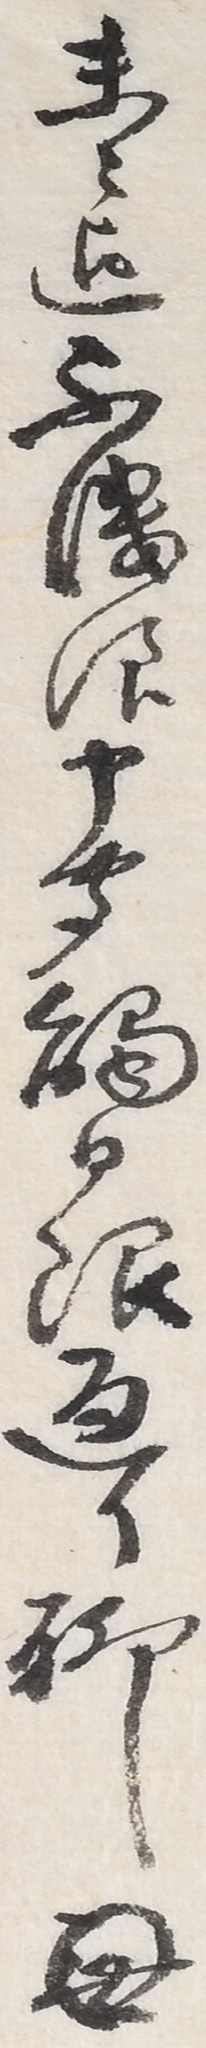末々迄不洩様申聞触日限通り聊
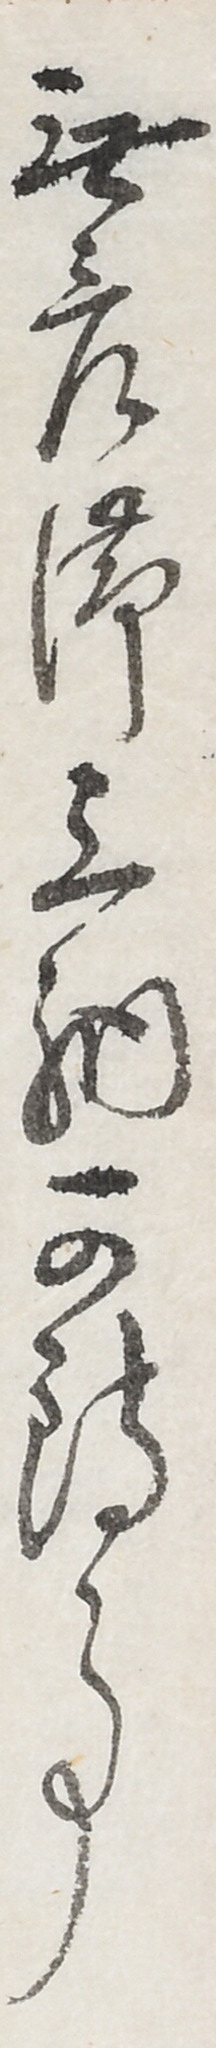無差滞上納可致事
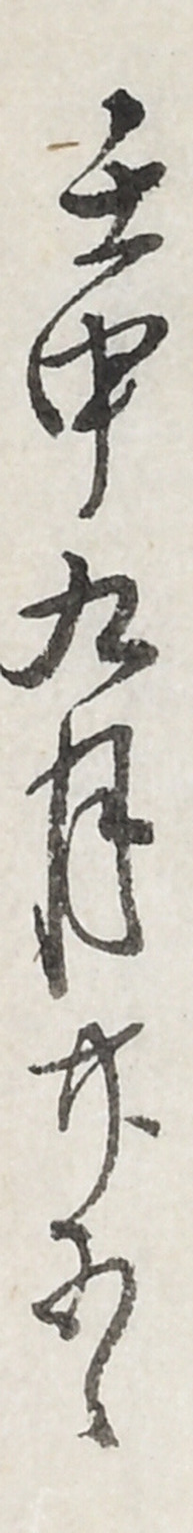壬申九月廿五日
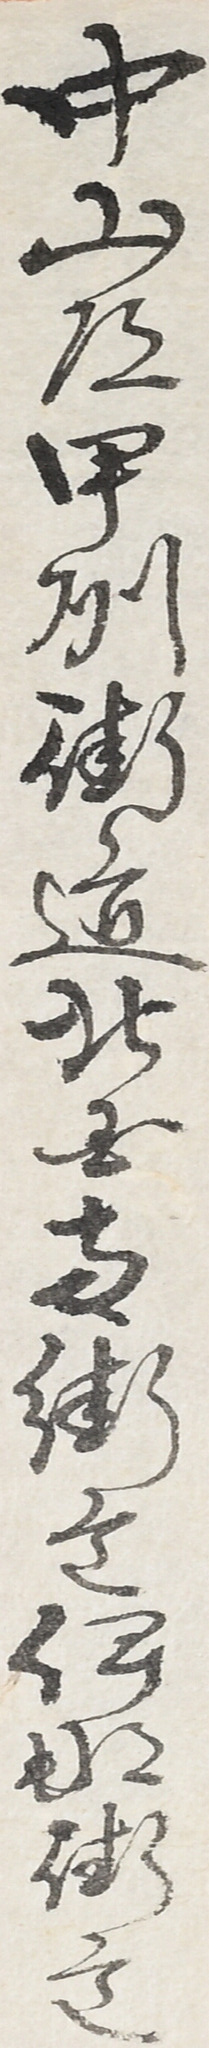中山道甲州街道北国両街道伊那街道
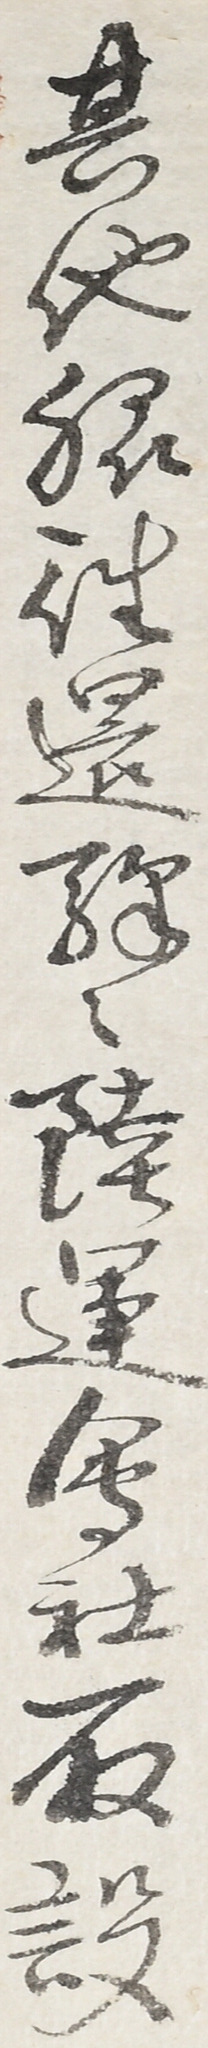其他脇往還駅々陸運会社取設
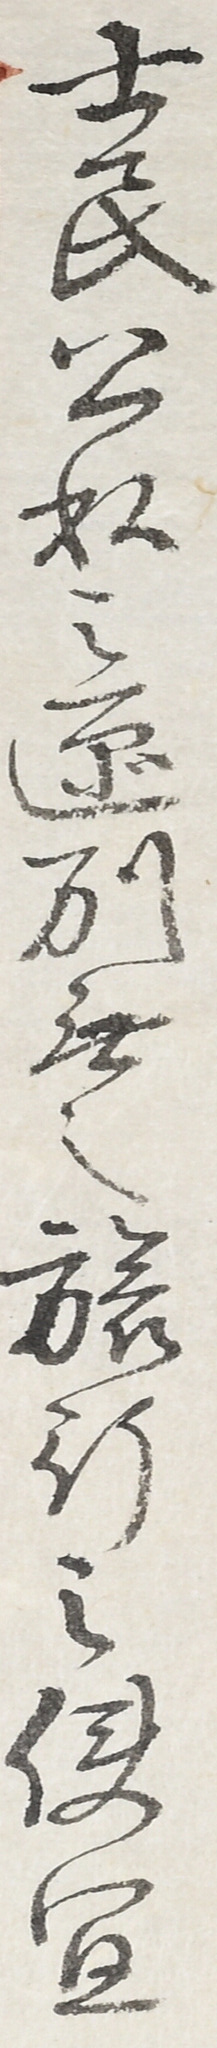士民公私之区別無之旅行之便宜
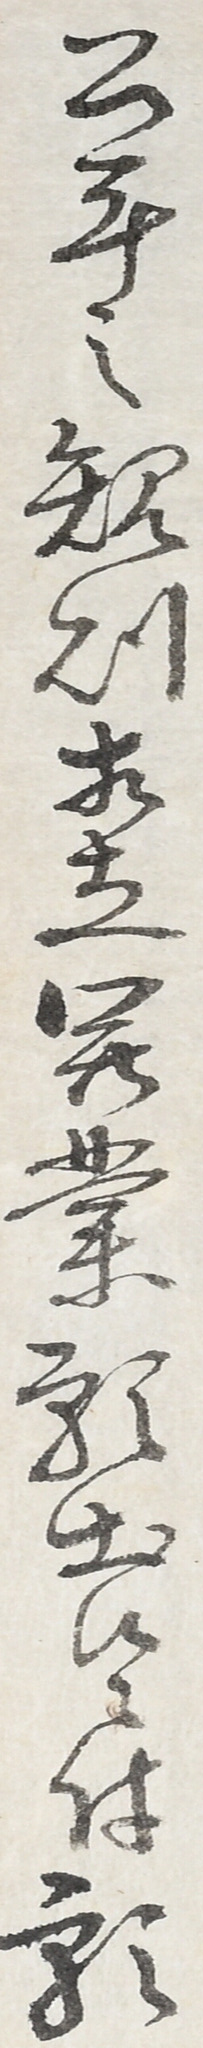公平之規則相立開業願出候に付願
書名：壹番・御布告一式
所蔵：伊那市立高遠町図書館・合同会社AMANE
